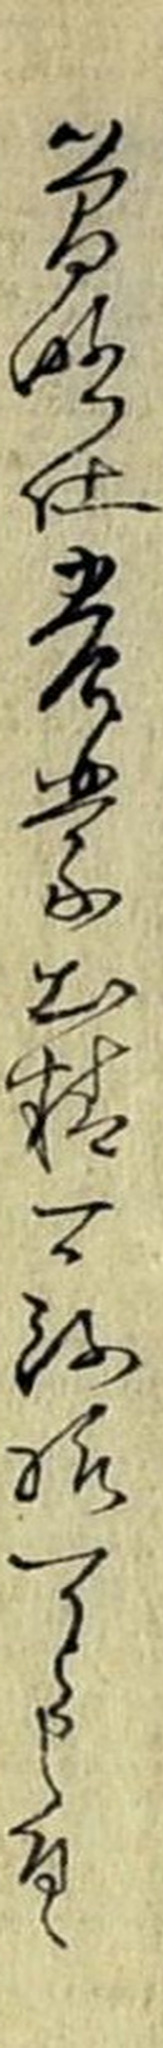簡略仕当業出精可致様可被申付候
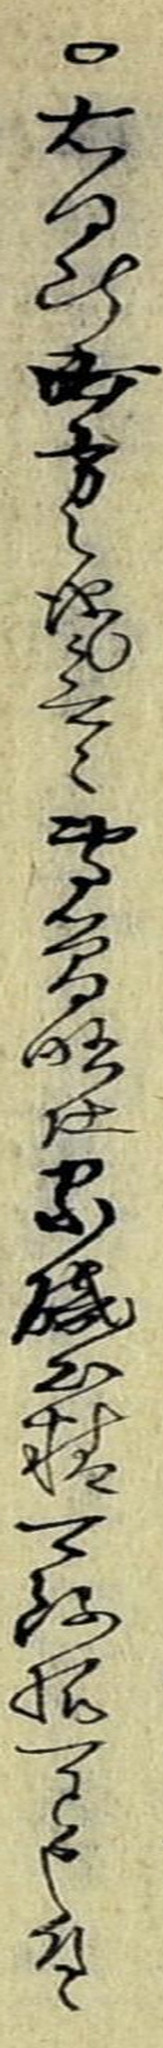○右同断町方之儀も云々専簡略仕家職出精可致様可被申付候
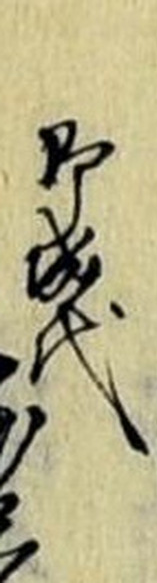御城代
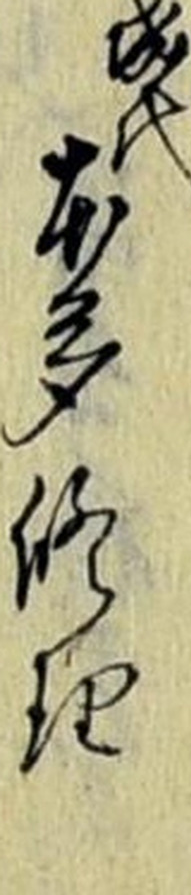本多修理
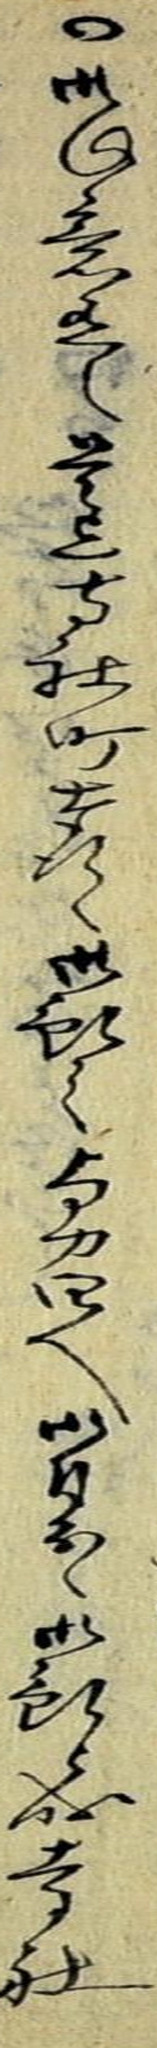○御趣意有之是迄寺社町奉行へ御預之与力四人御自分へ御預被成寺社
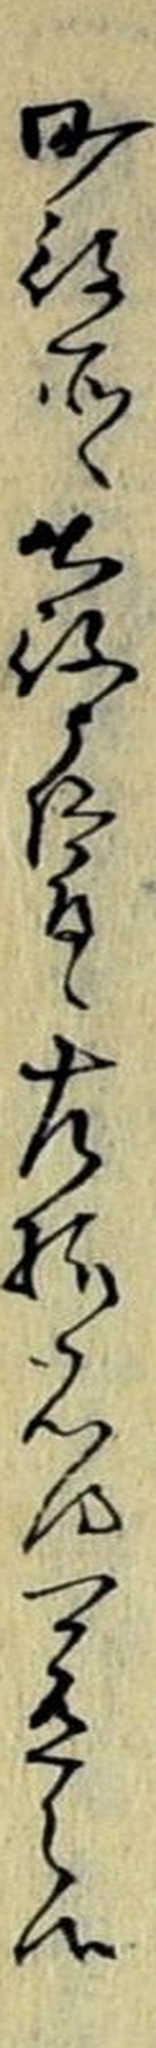町役所へ出役被仰付候左様御心得可有之候
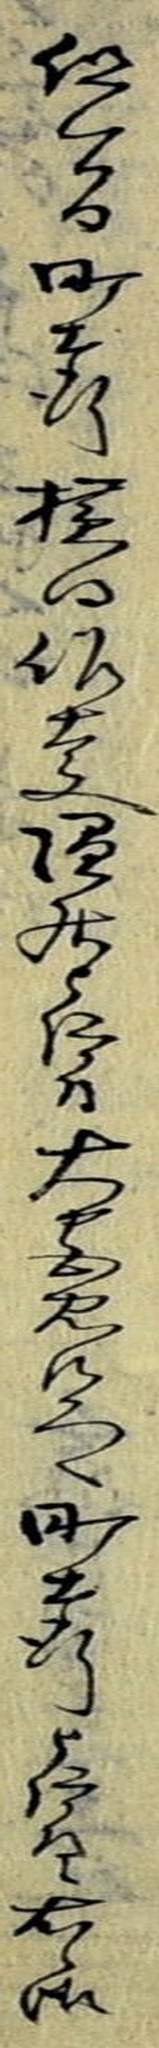但今日町奉行横田作太夫隠居被仰付大宮忠左衛門へ町奉行被仰付候右之趣
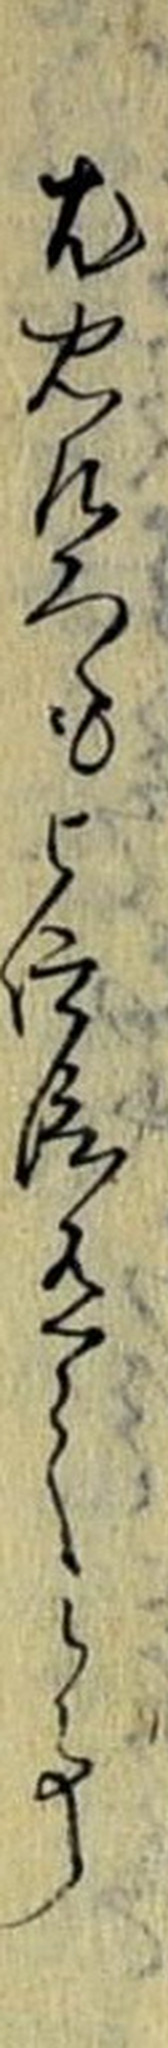尤忠左衛門へも被仰渡有之候事
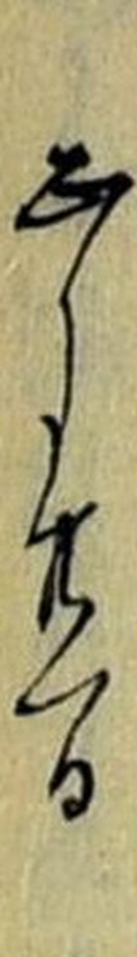正月廿一日
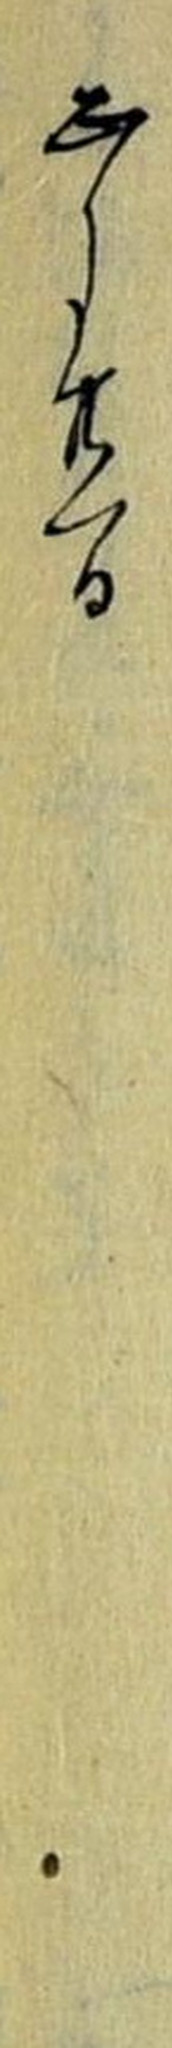正月廿一日
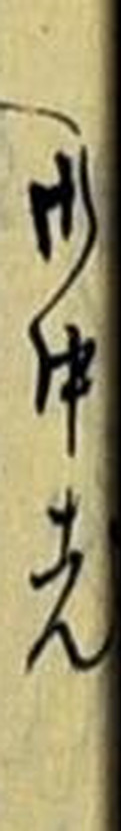御中老
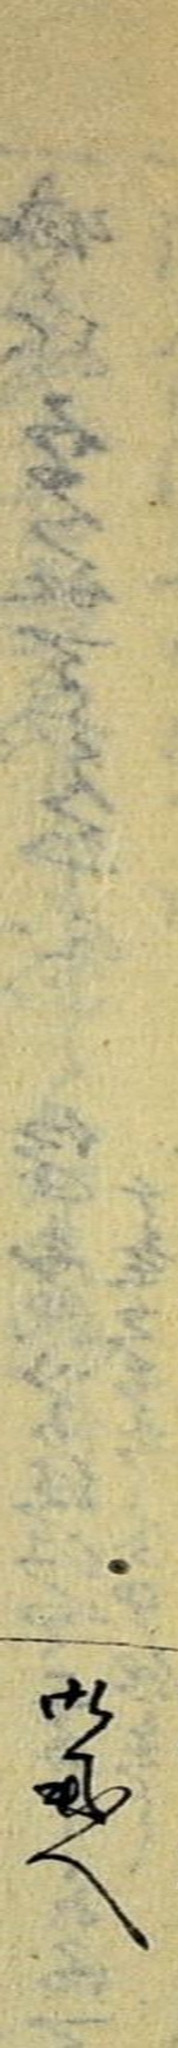御用人
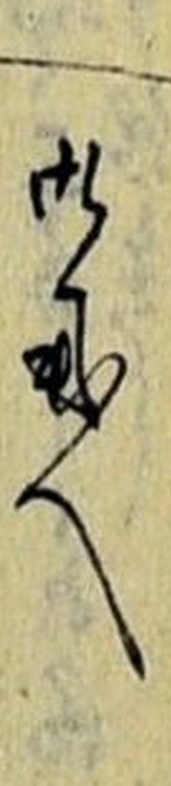御用人
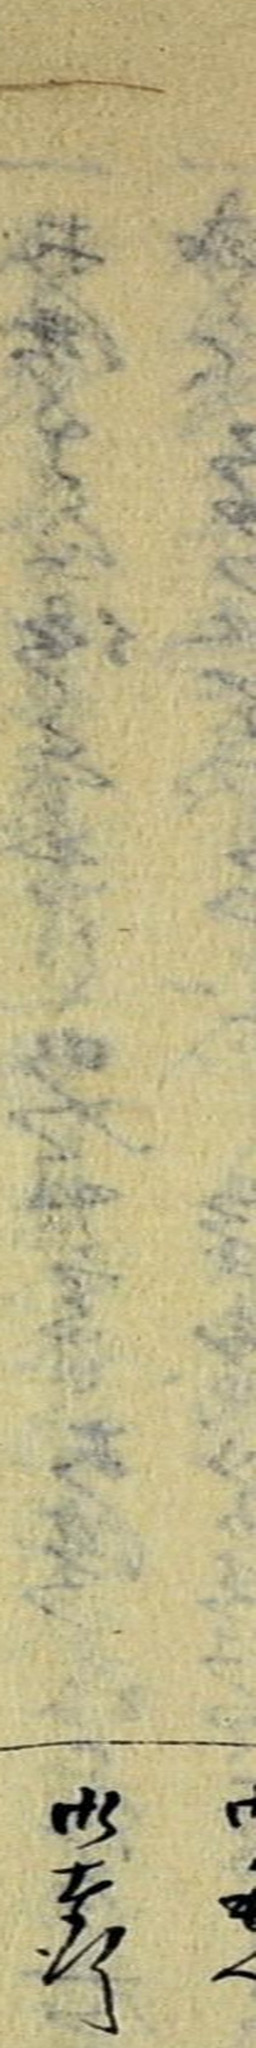御奉行
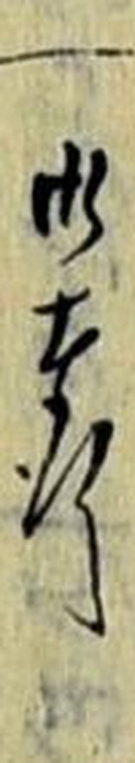御奉行
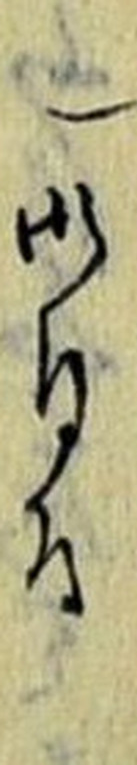御目付
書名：命令之部 四
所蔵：福井県文書館 Fukui Prefectural Archives
